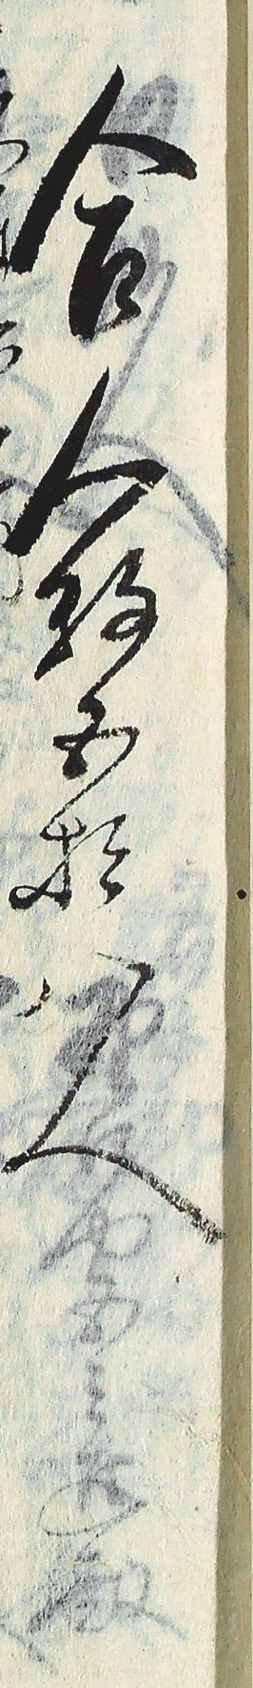合人数五拾八人
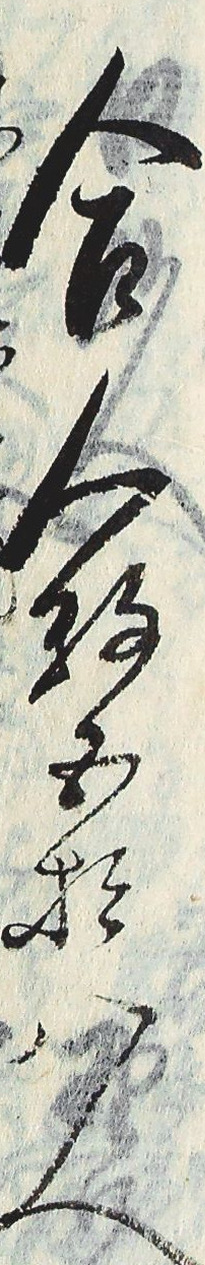合人数五拾八人
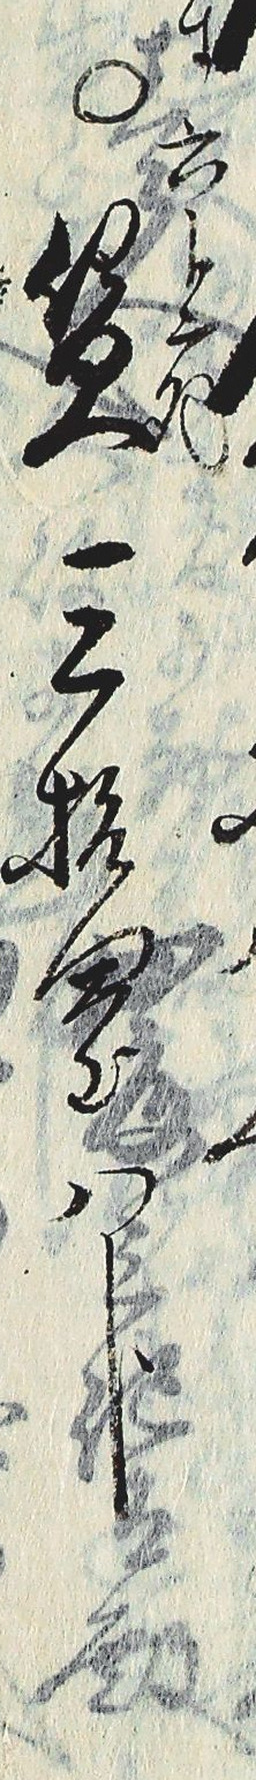賃三拾四匁八分
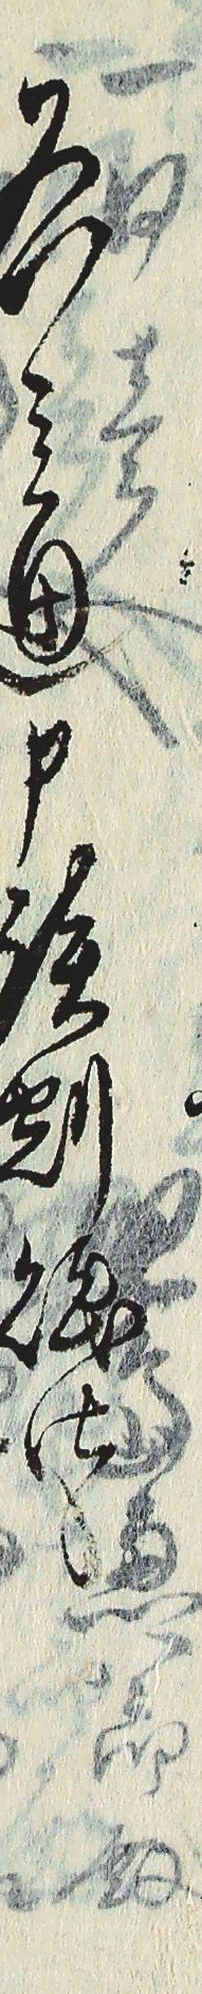右之通申談割賦仕候
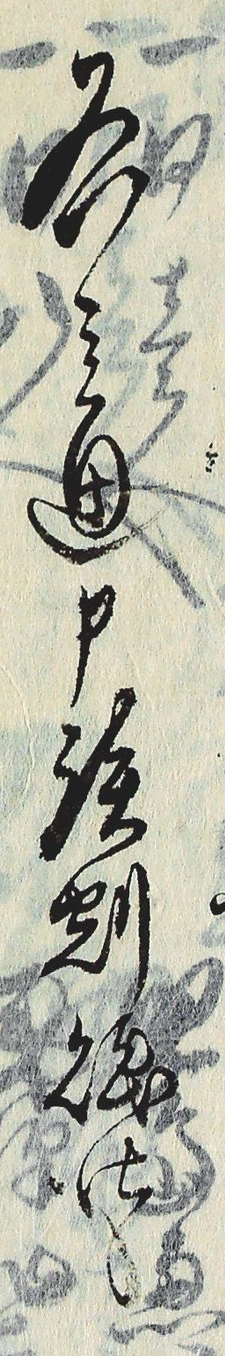右之通申談割賦仕候
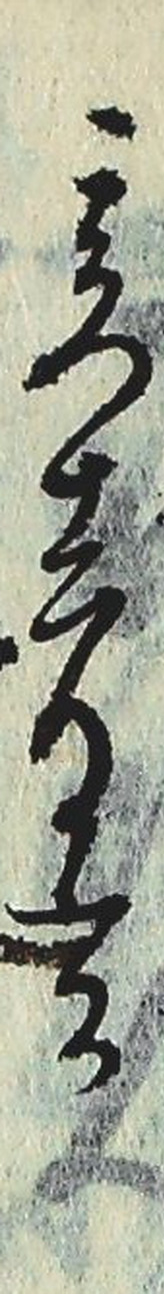亥十二月六日
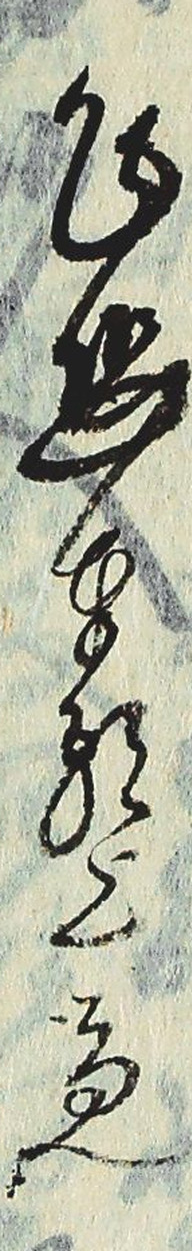乍恐奉願上覚
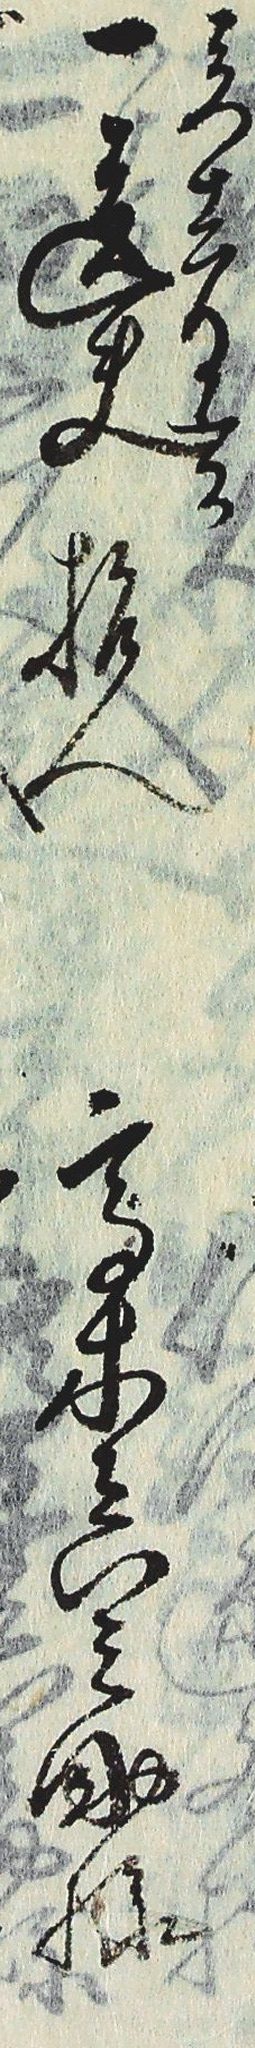一送夫拾人高木真之助様
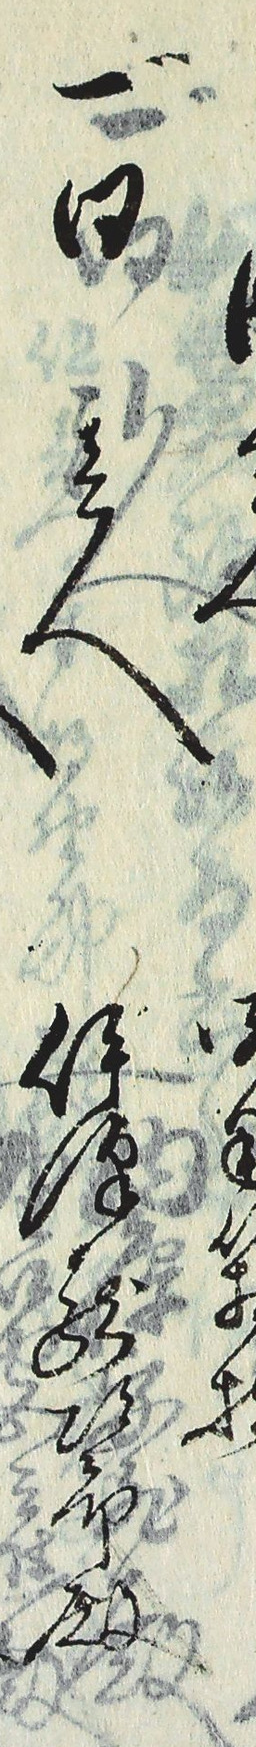一同壱人伊沢龍次郎殿

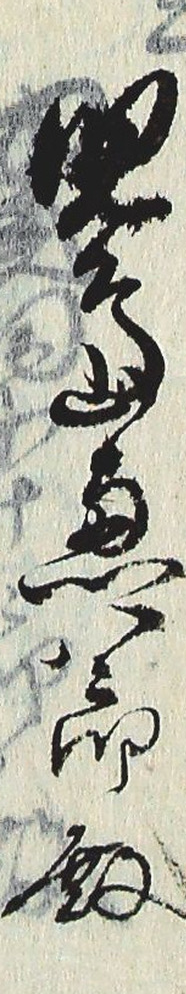児島恵八郎殿
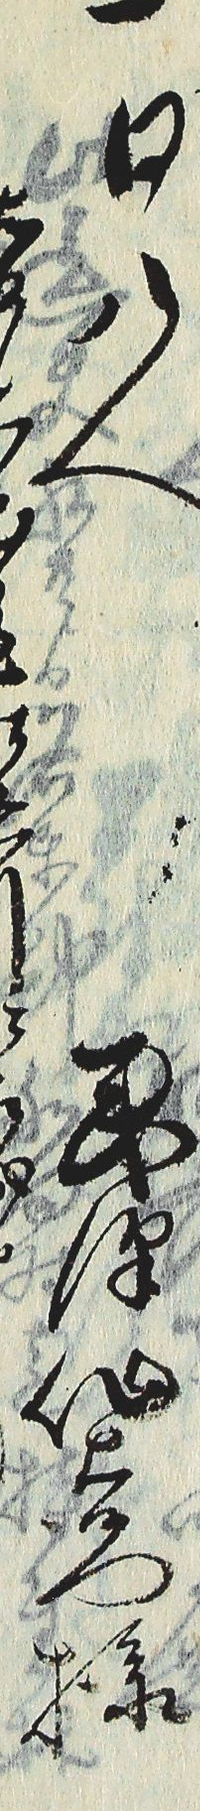一同八人民沢作右衛門様
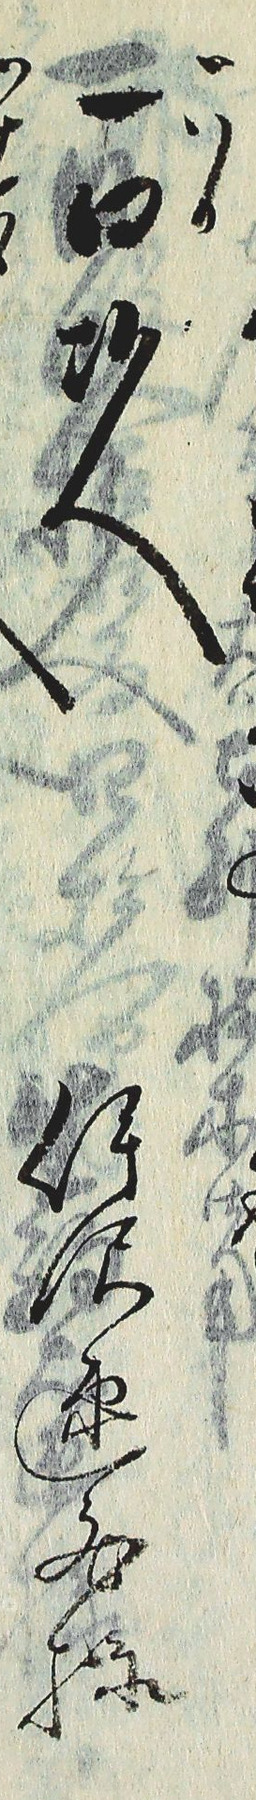一同弐人伊沢速蔵様
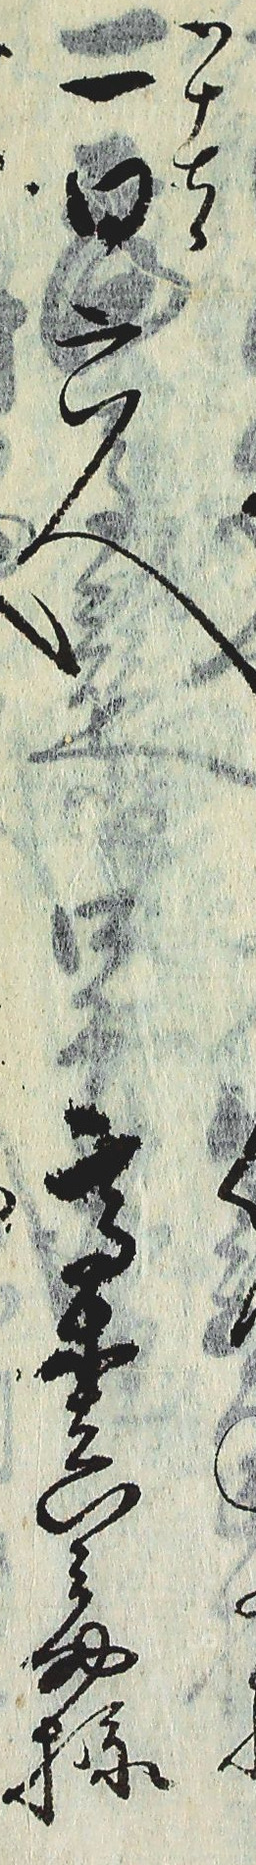一同六人高木真之助様
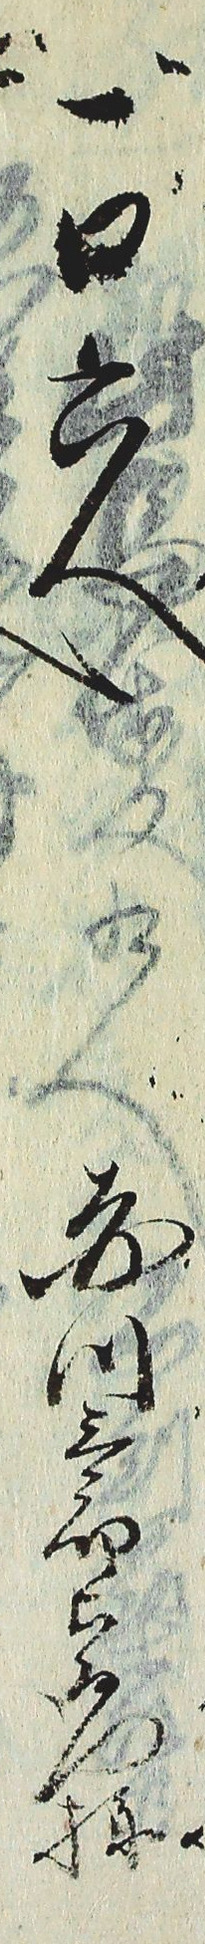一同六人赤川三郎右衛門様
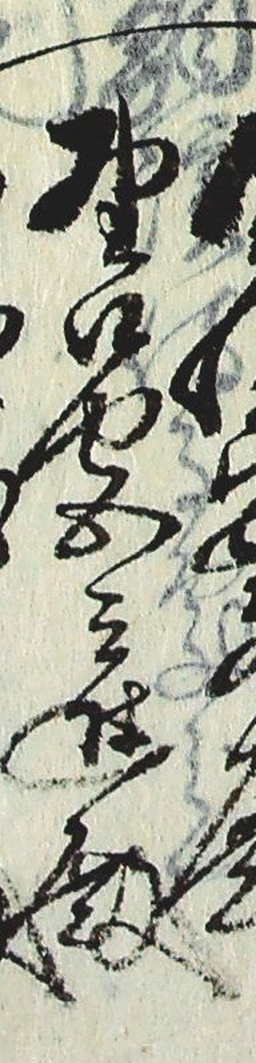野口宮之進殿
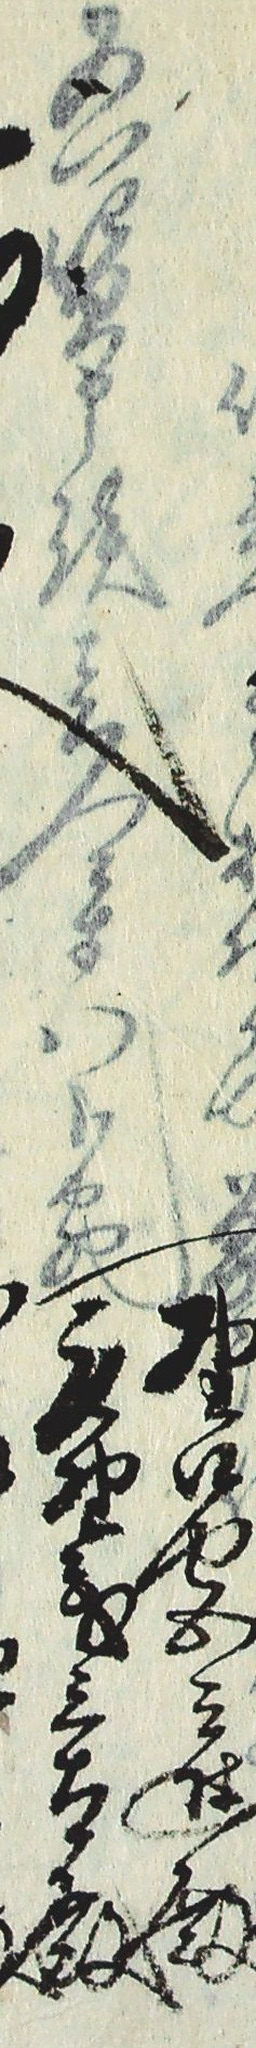庄野義三太殿
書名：名東郡中諸割賦元帳
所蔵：鳴門教育大学 Naruto University of Education
